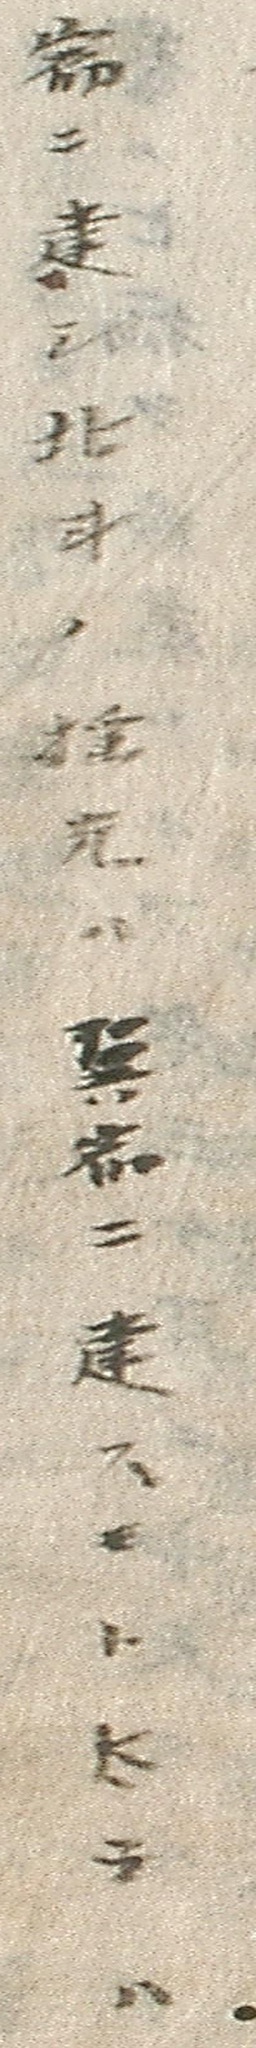宿ニ建シ北斗ノ揺光ハ翼宿ニ建スモト太子ハ
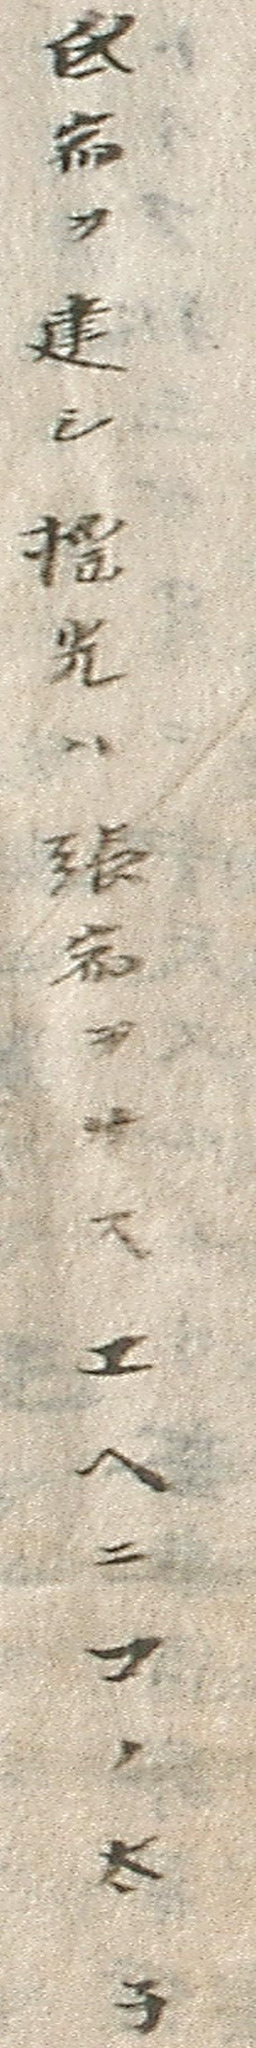氐宿ヲ建シ揺光ハ張宿ヲサスユヘニコノ太子
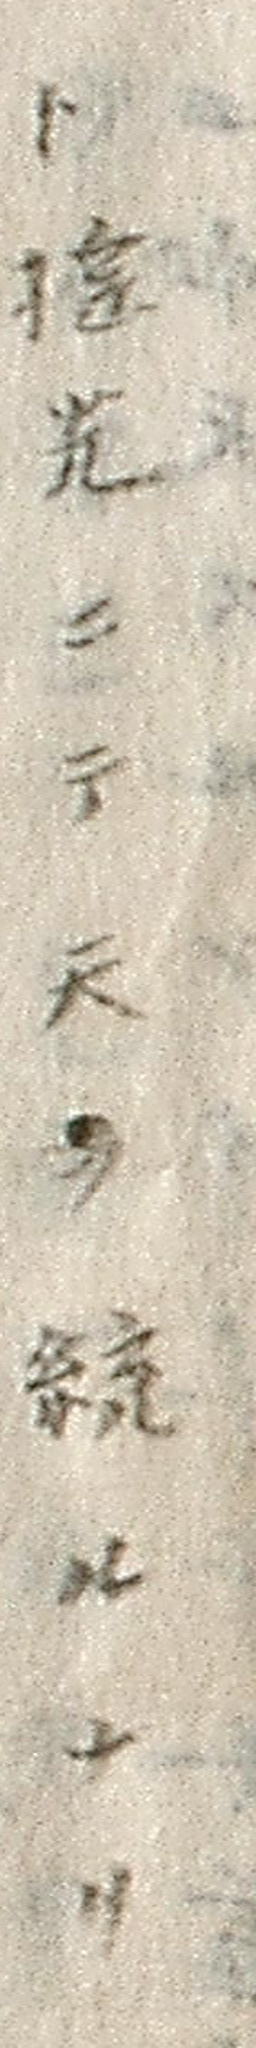ト揺光ニテ天ヲ統ルナリ
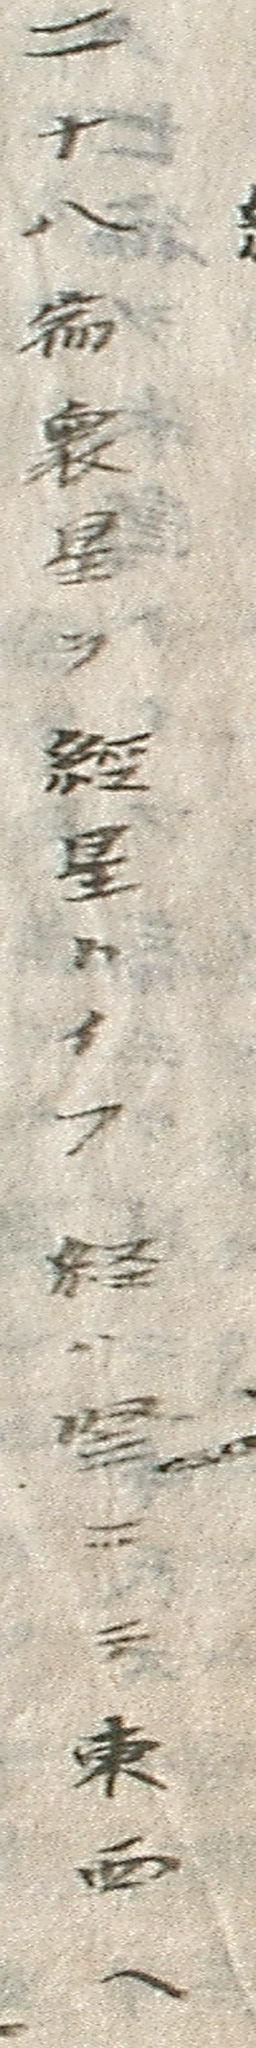二十八宿衆星を経星トイフ経ハ竪ニテ東西ヘ
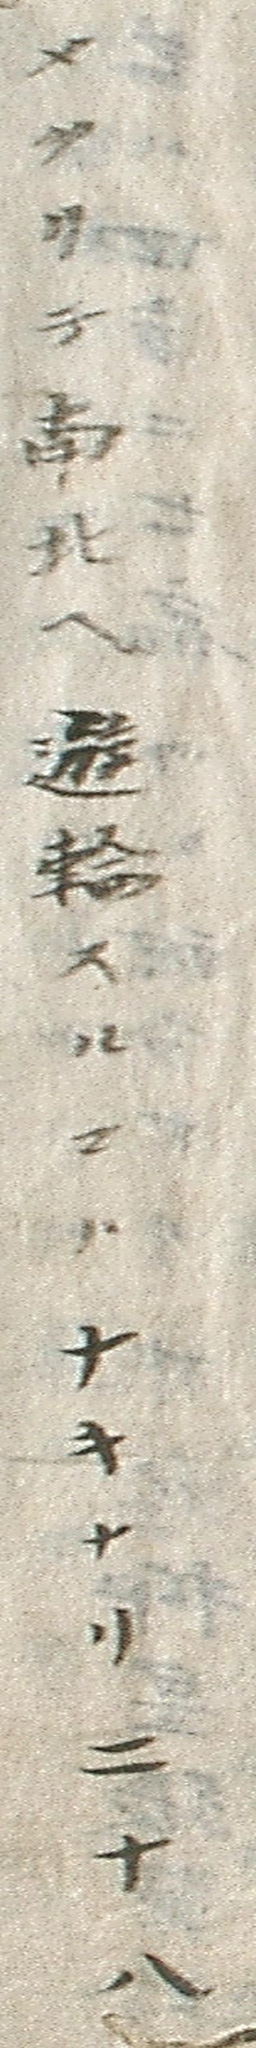メクリテ南北ヘ遊輪スルコトナキナリ二十八

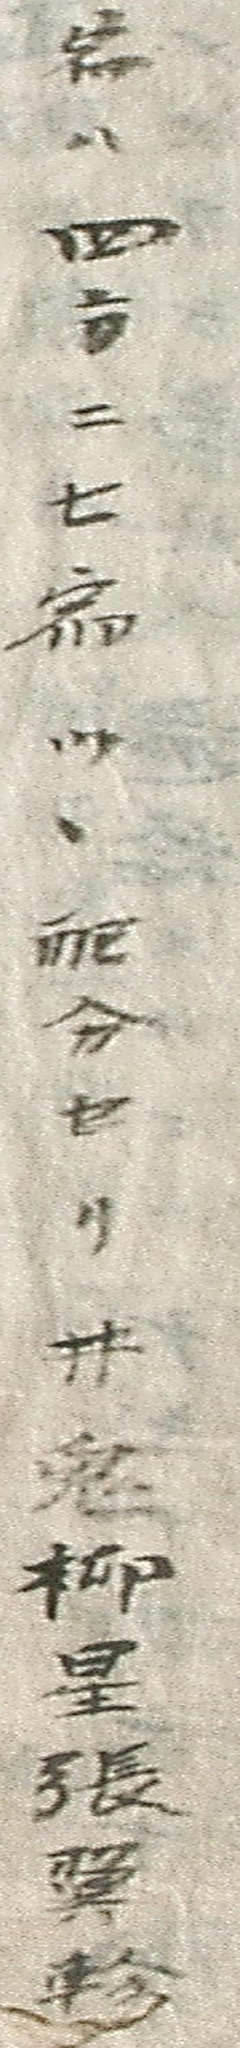宿ハ四方ニ七宿ツヽ配分セリ井鬼柳星張翼軫
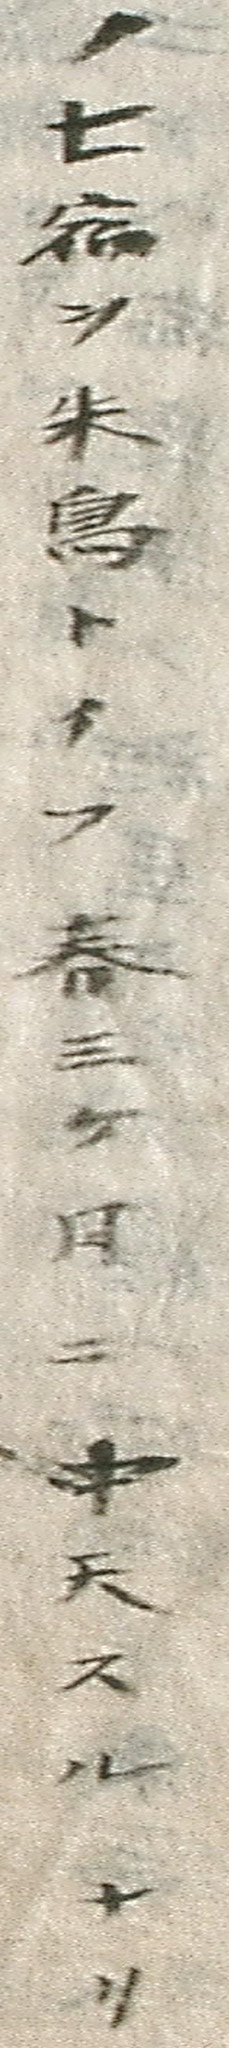ノ七宿ヲ朱鳥トイフ春三ヶ月ニ中天スルナリ
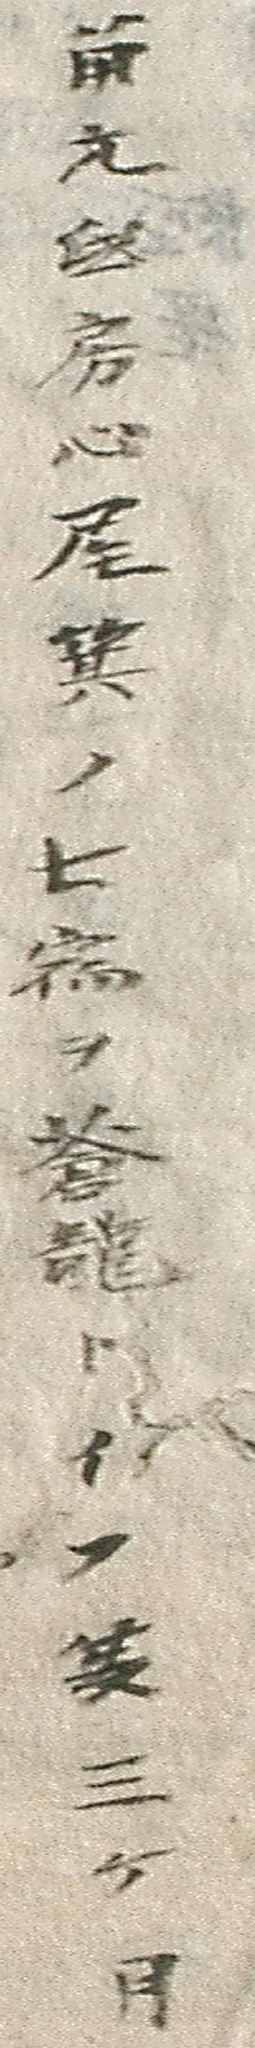角亢氐房心尾箕ノ七宿ヲ蒼龍トイフ其三ヶ月
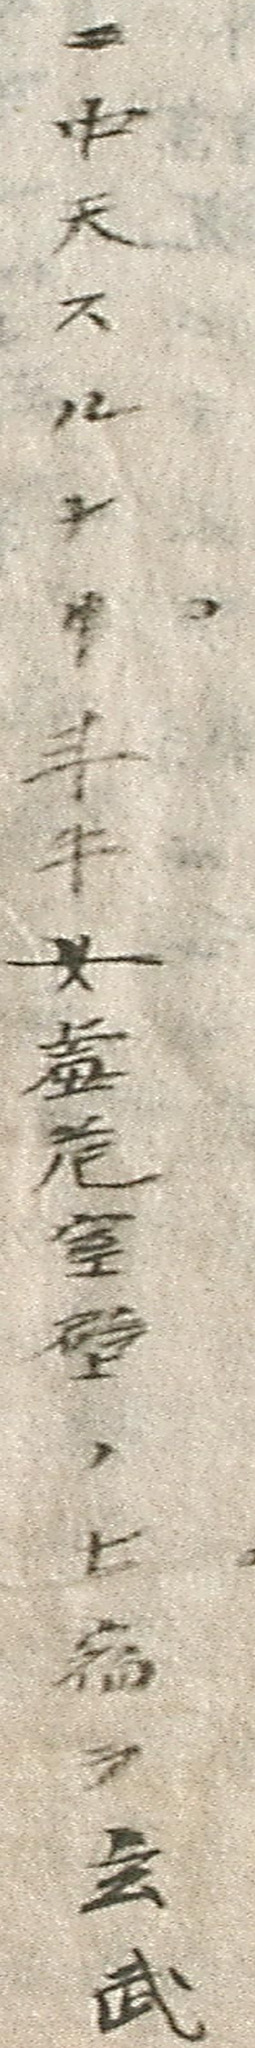ニ中天スルナリ斗牛女虚危室壁ノ七宿ヲ玄武
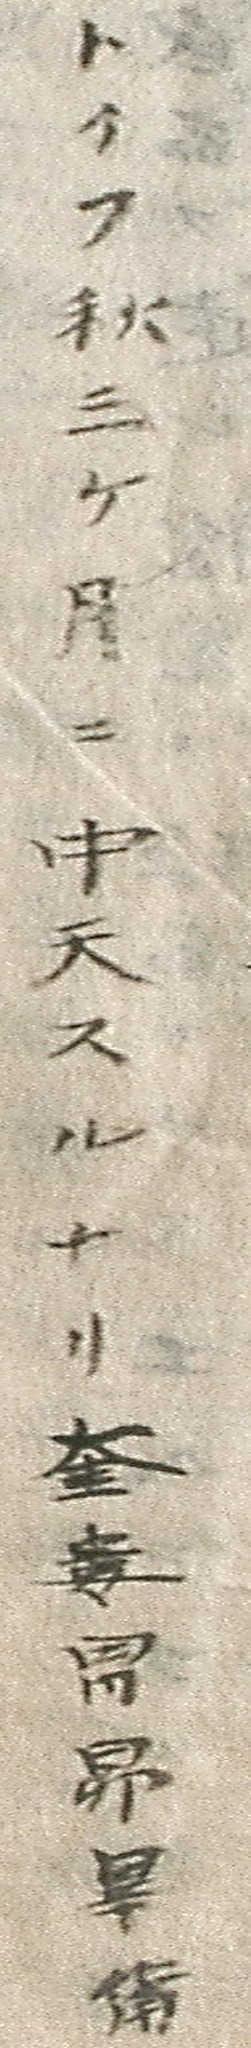トイフ秋三ヶ月ニ中天スルナリ奎婁胃昴畢觜
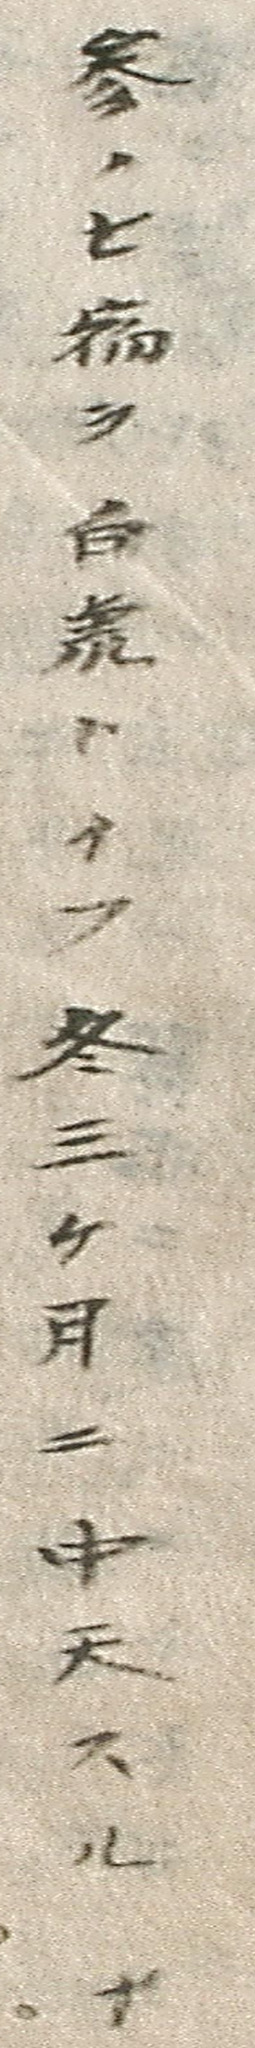参ノ七宿ヲ白虎トイフ冬三ヶ月ニ中天スルナ
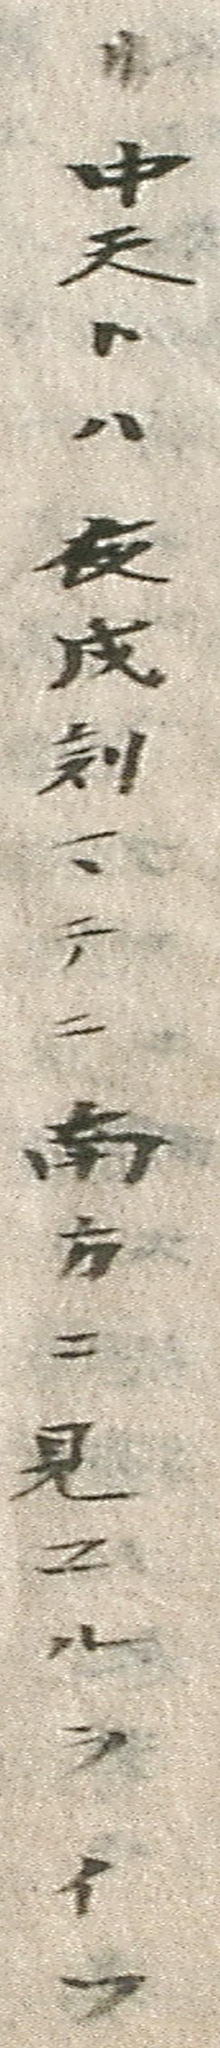リ中天トハ夜戌刻マテニ南方ニ見ユルヲイフ
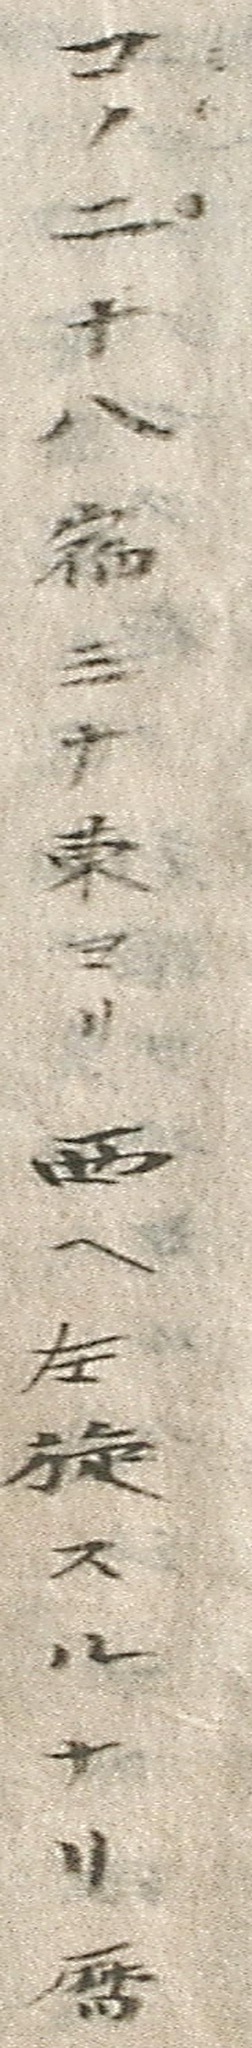コノ二十八宿ミナ東ヨリ西ヘ左旋スルナリ暦
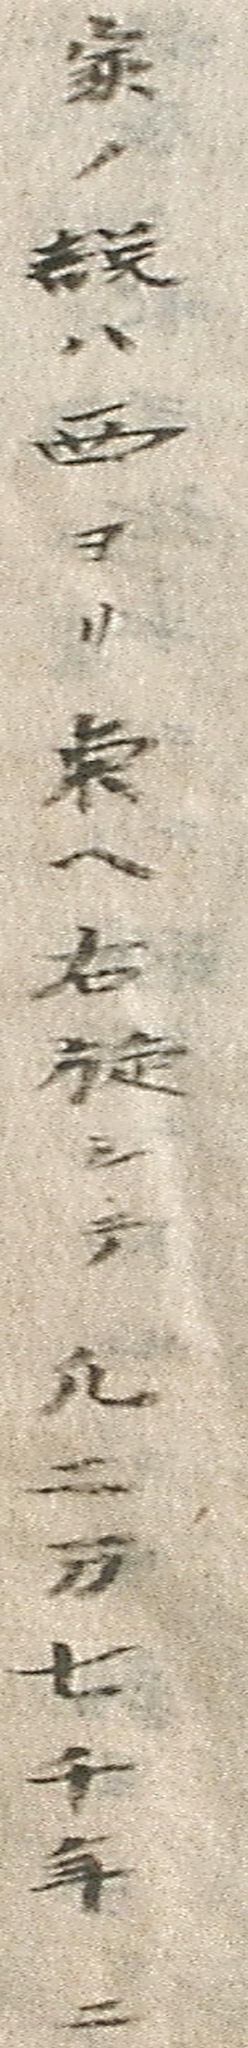家ノ説ハ西ヨリ東ヘ右旋シテ凡二万七千年ニ
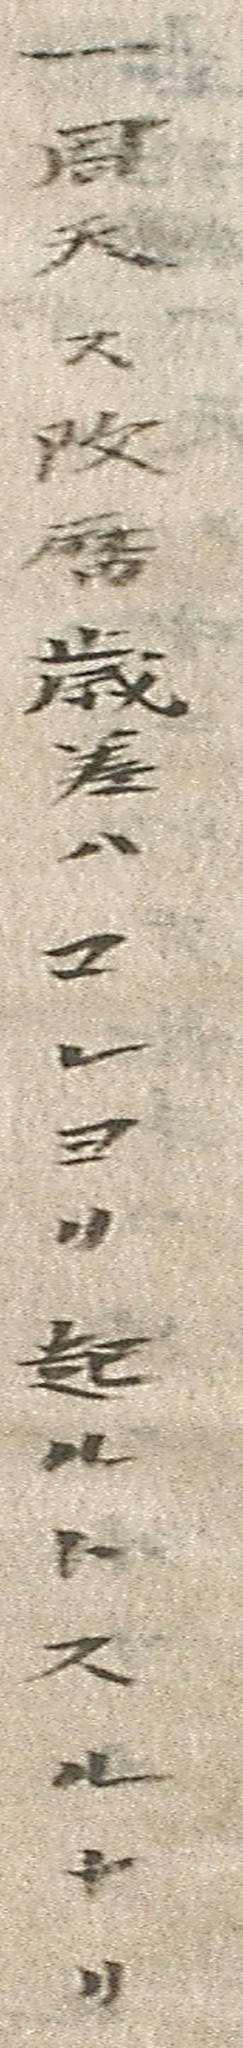一周天ス改暦歳差ハコレヨリ起ルトスルナリ
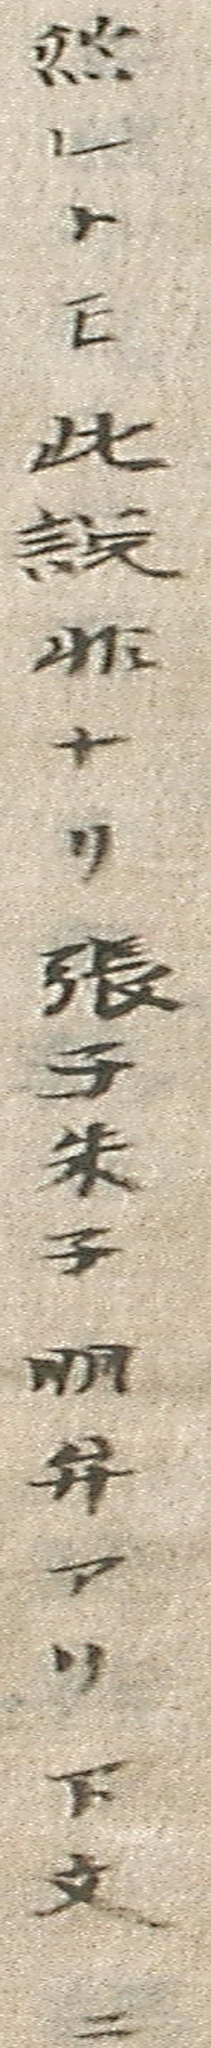然レトモ此説非ナリ張子朱子明弁アリ下文ニ
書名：天學便蒙図説
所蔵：東京大学地震研究所図書室 Earthquake Research Institute Library, The University of Tokyo, JAPAN
